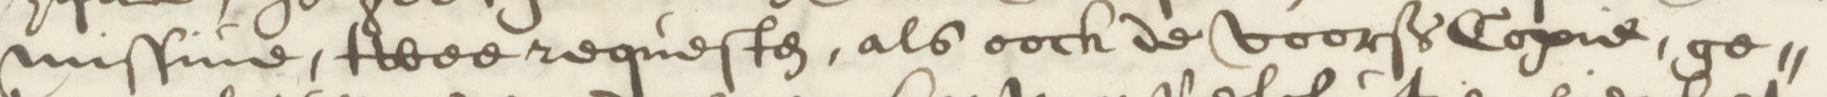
missive, twee requesten, als oock de voors Copie, ge„
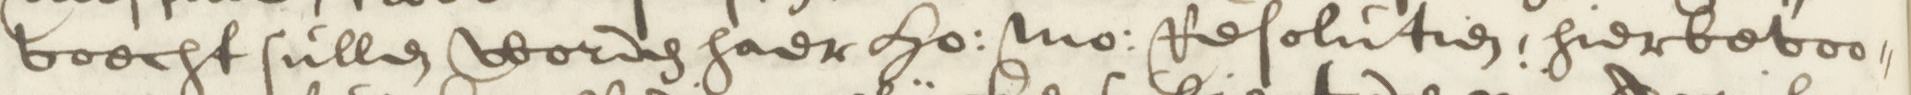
voecht sullen worden haer Ho:Mo: Resolutien, hierbevoo„
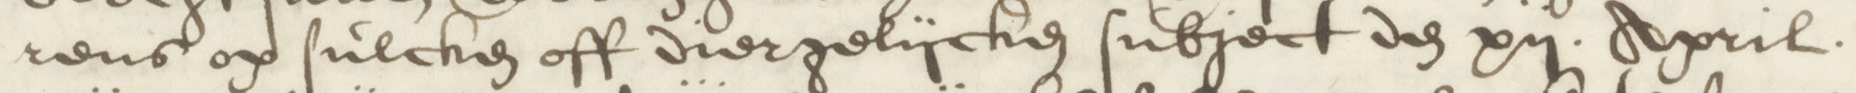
rens op sulcken off diergelijcken subject den xij. April.
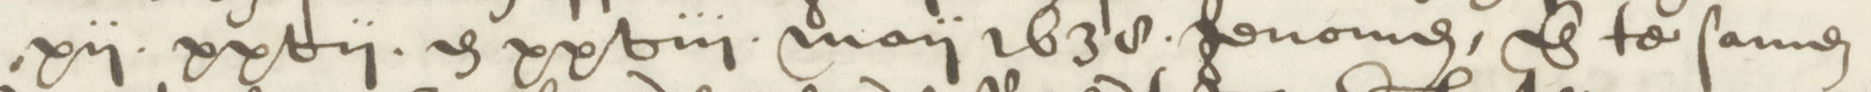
xij. xxvij. en xxviij. maij 1638. genomen, & te samen
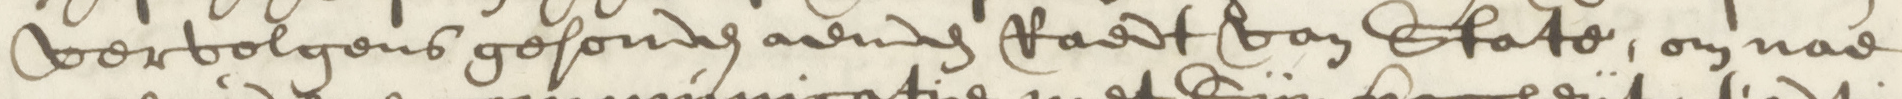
vervolgens gesonden aenden Raedt van State, om nae
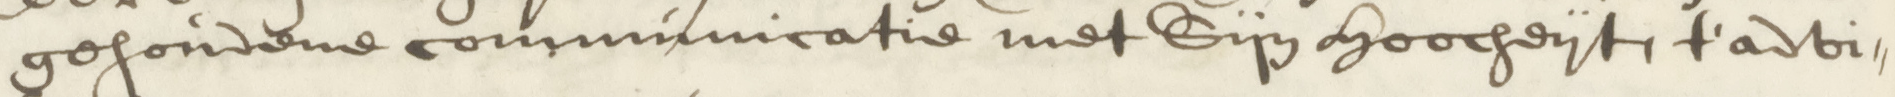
gehoudene communicatie met Sijn Hoocheijt, t'advi„
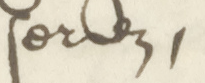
seren.
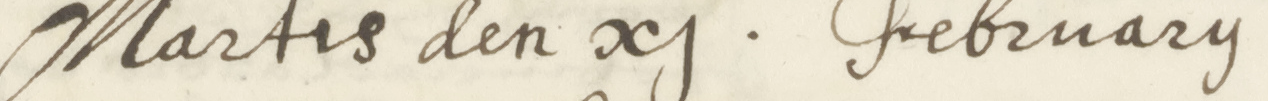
Martis den xjen. Februarij
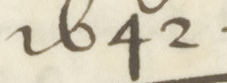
1642
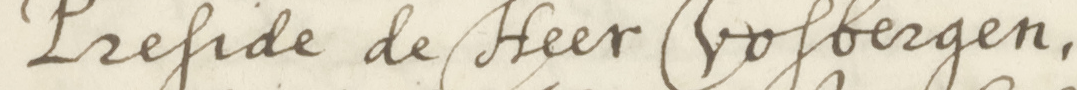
Preside de Heer Vosbergen,
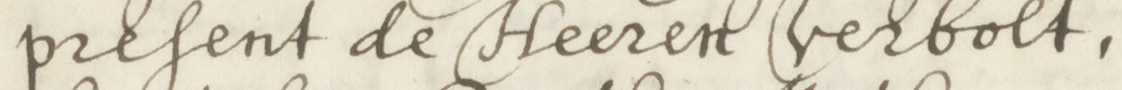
present de Heeren Verbolt,
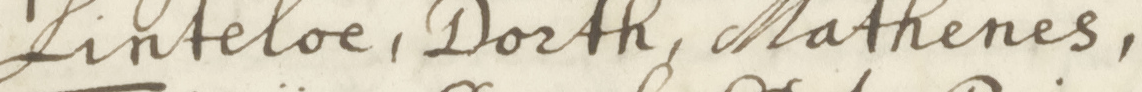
Linteloe, Dorth, Mathenes,
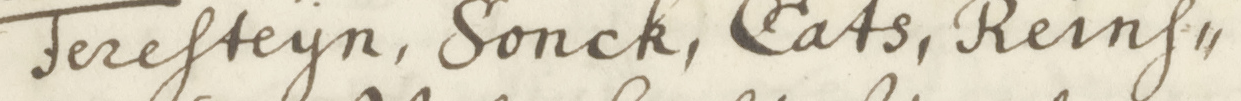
Teresteijn, Sonck, Cats, Reins„
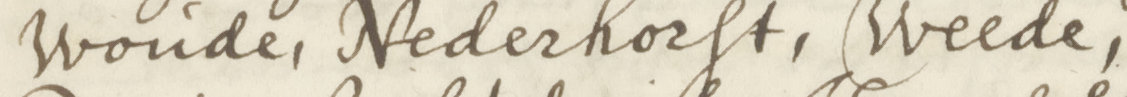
woude, Nederhorst, Weede,
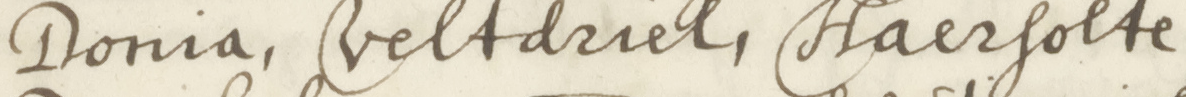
Donia, Veltdriel, Haersolte,
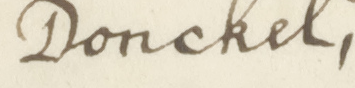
Donckel,
